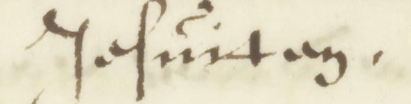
Jesuiten.
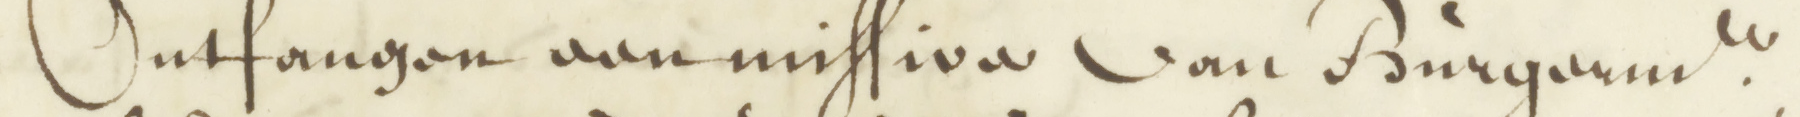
Ontfangen een missive van Burgermr.
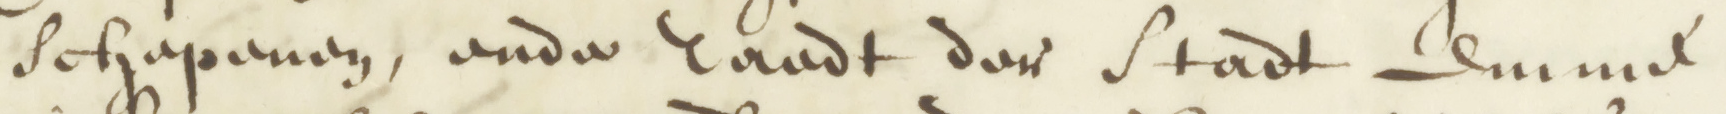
Schepenen, ende raedt der Stadt Emme„
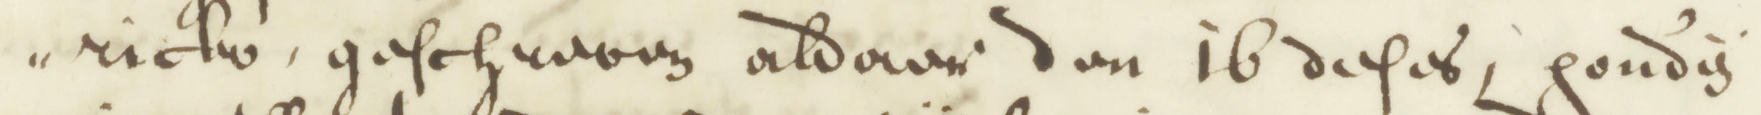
,,rick, geschreven aldaer den 16 deses, houden
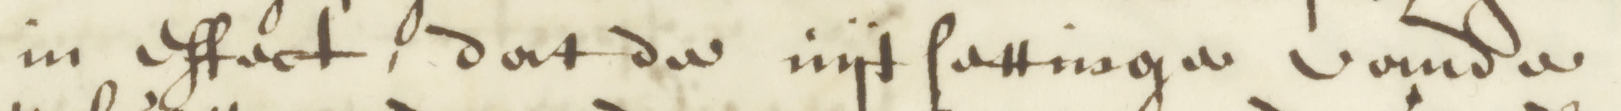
in effect, dat de uijtsettinge vande
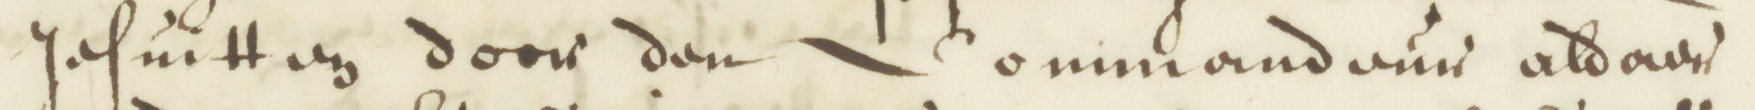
Jesuitten door den Commandeur aldaer
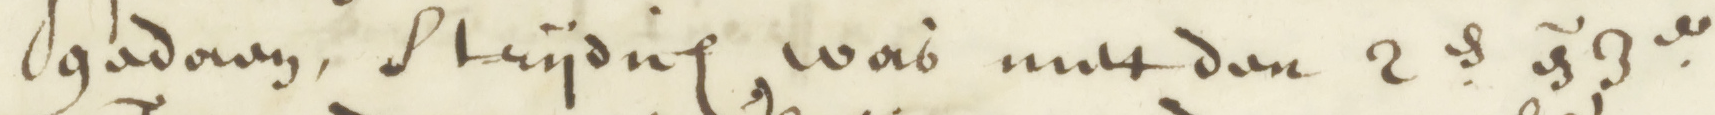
gedaen, Strijdich was met den 2e en 3e
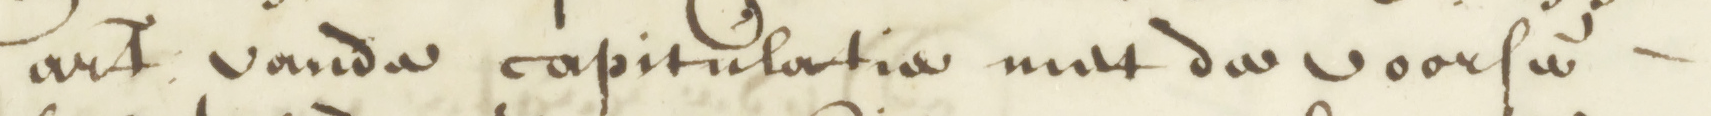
art vande capitulatie met de voorsr -
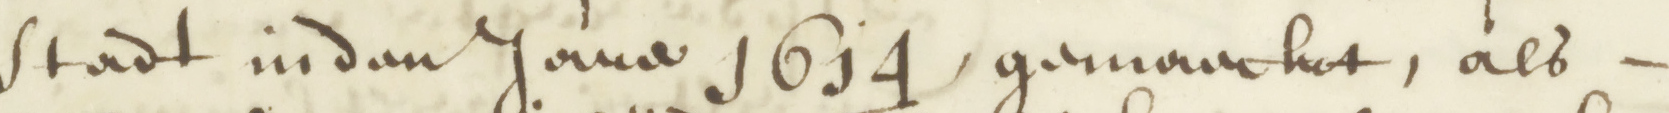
stadt inden Jare 1614 gemaeckt, als -
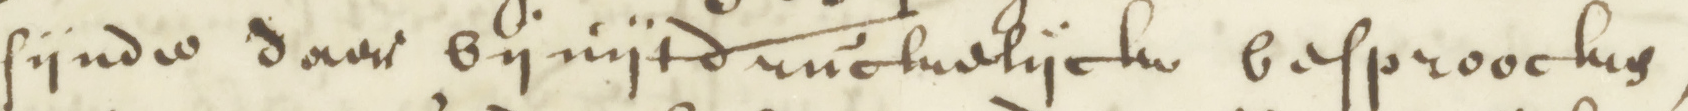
sijnde daer bij uijtdruckelijck besproocken,
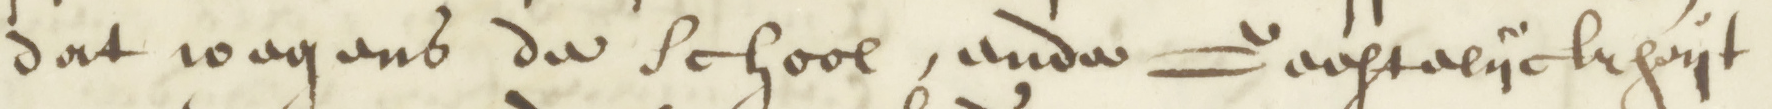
dat wegens de school, ende Geestelijckheijt
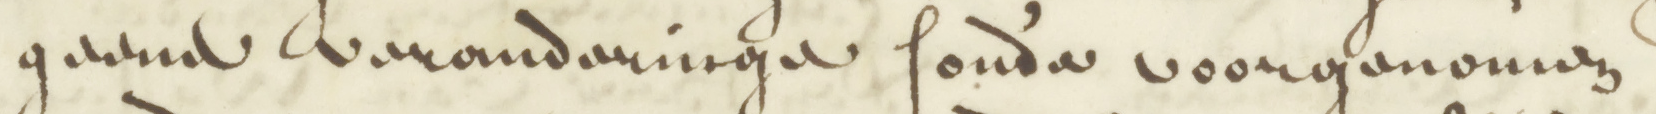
geene veranderinge soude voorgenomen
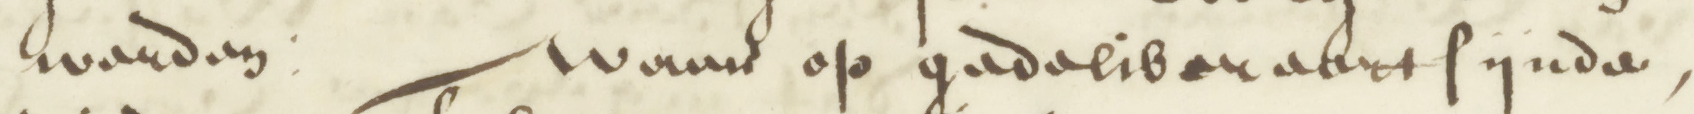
werden. waer op gedelibereert sijnde,
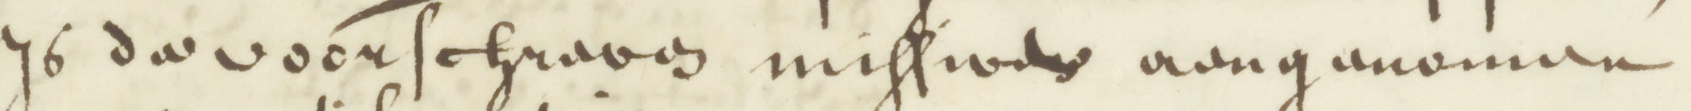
Is de voorschreven missive aengenomen
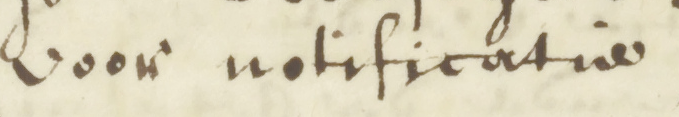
voor notificatie.
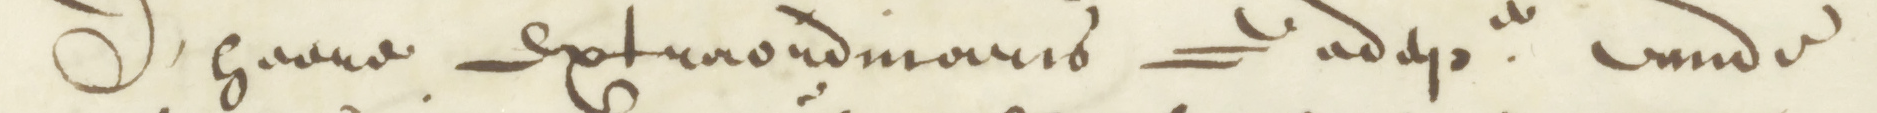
D'heere Extraordinaris Gedepe vande
